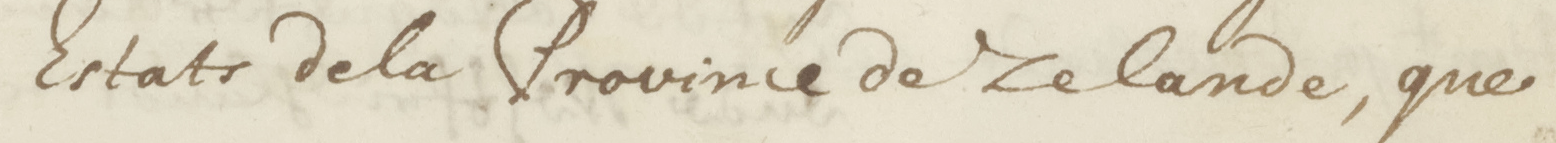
Estats de la Province de Zelande, que
